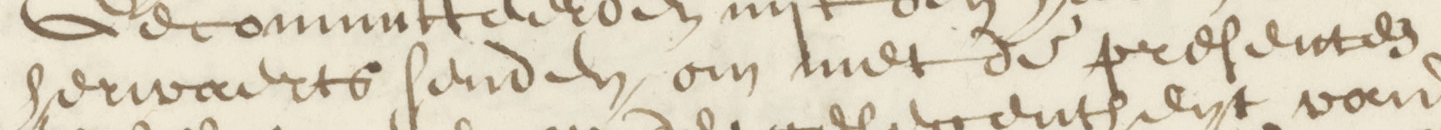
herwaerts senden, om met de presenten
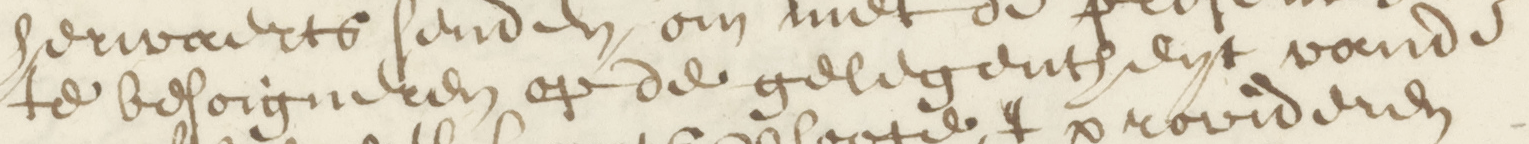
te besoigneren op de gelegentheyt vande
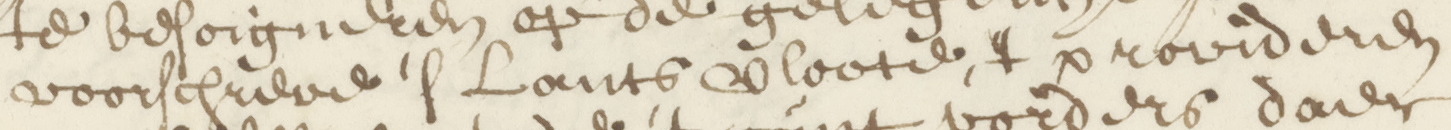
voorschreve ‛s Lants Vloote, ‛t provideren
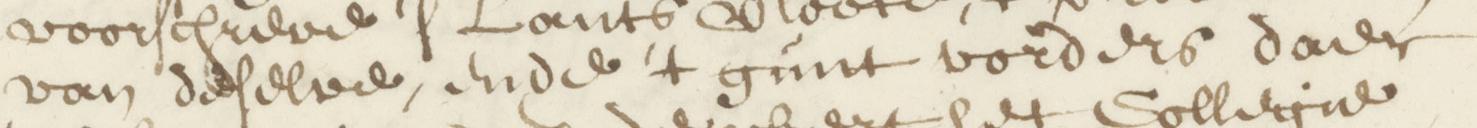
van deselve, ende ‛t gunt vorders daer
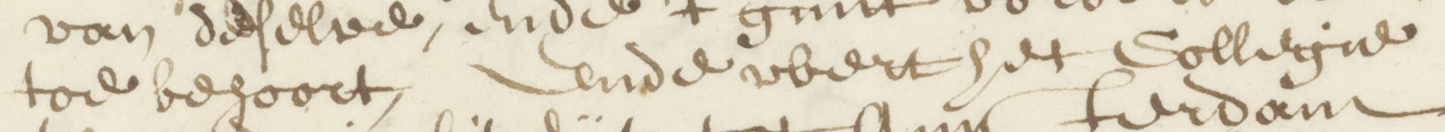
toe behoort. Ende wert het Collegie
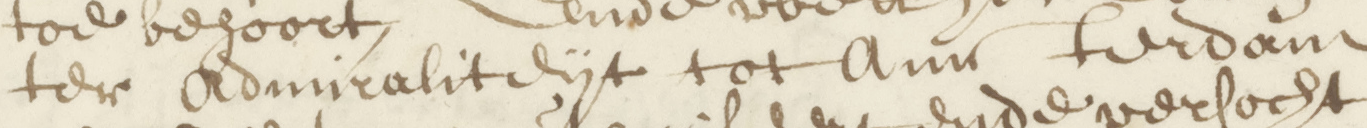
ter Admiraliteijt tot Amsterdam
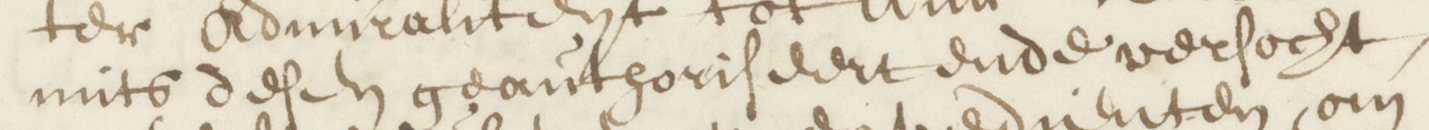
mits desen geauthoriseert ende versocht,
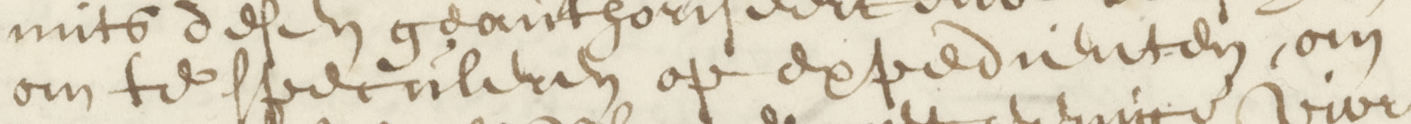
om te speculeren op expedienten, om
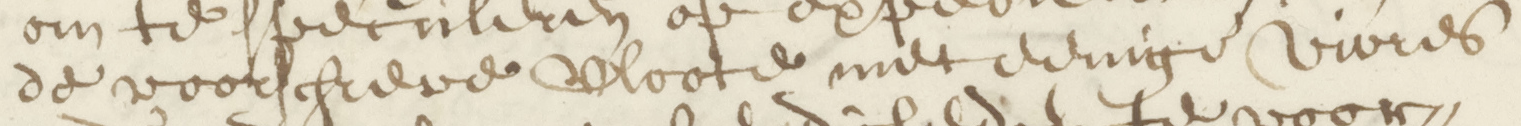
de voorschreve Vloote met eenige vivres
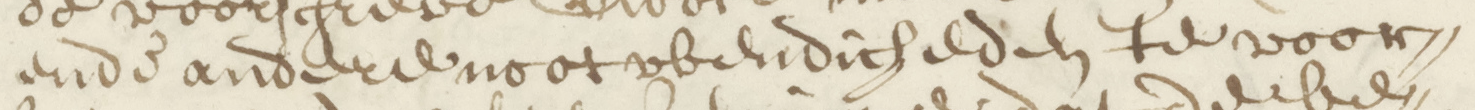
ende andere nootwendicheden te voor„
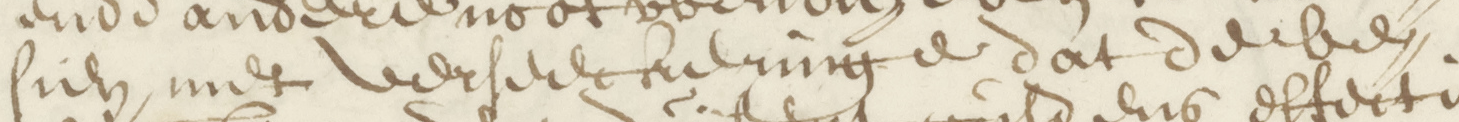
sien, met verseeckeringe dat de be„
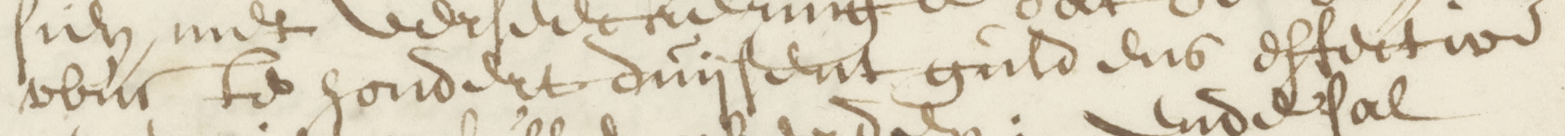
wuste hondert duijsent guldens effective
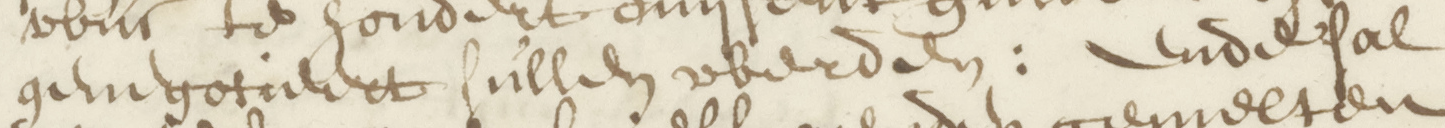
genegotieert sullen werden: Ende sal
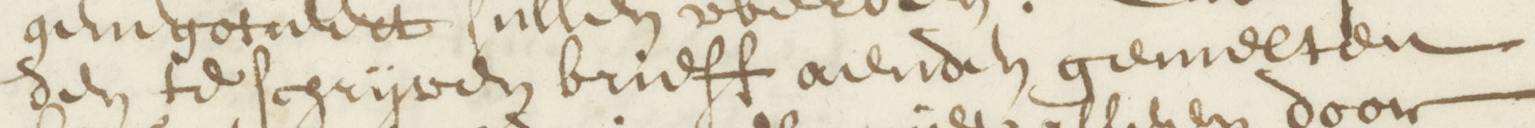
den te schrijven brieff aenden gemelten
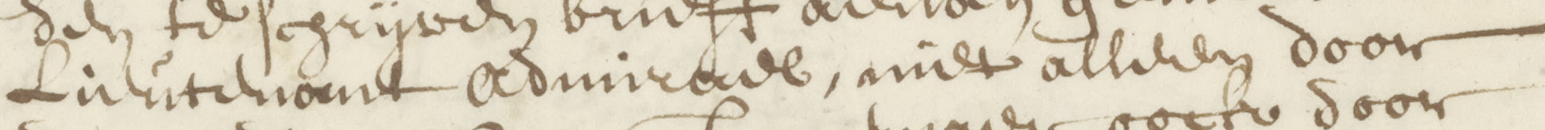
Lieutenant Admirael, niet alleen door
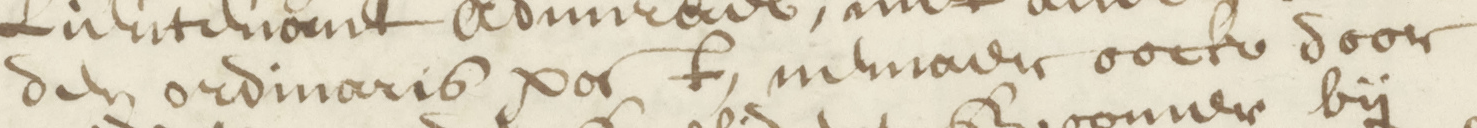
den ordinaris post, nemaer oock door
